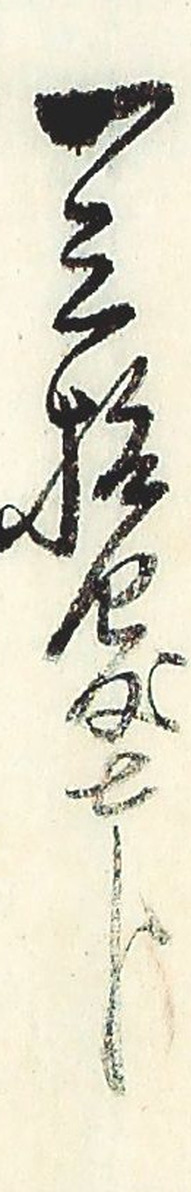一拾四匁七分
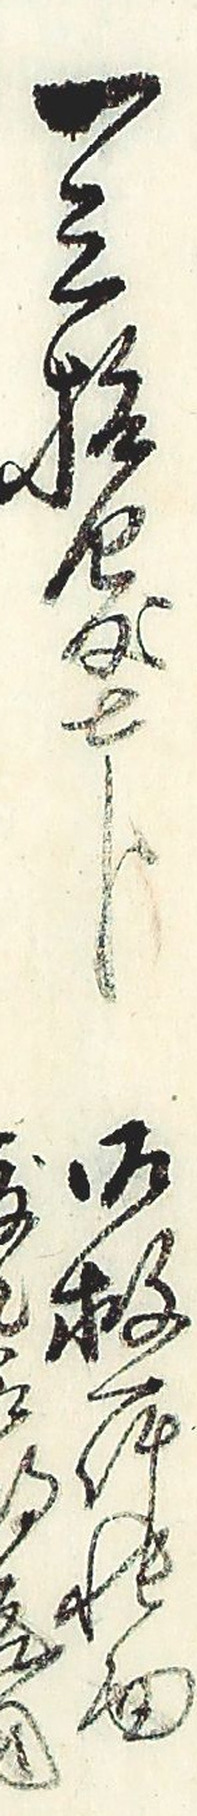一三拾四匁七分御救一件帳面
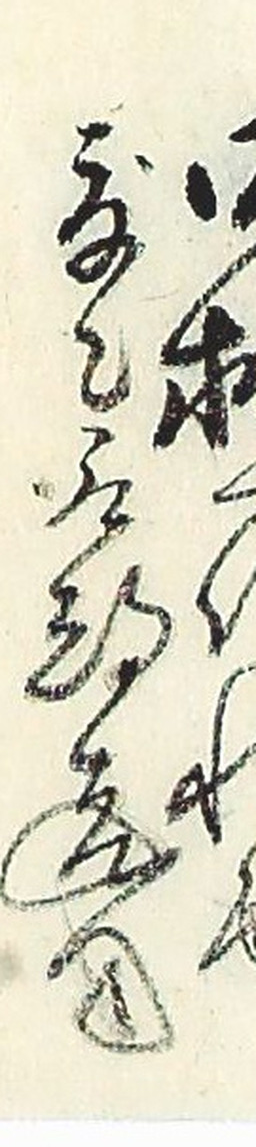度々取都造用
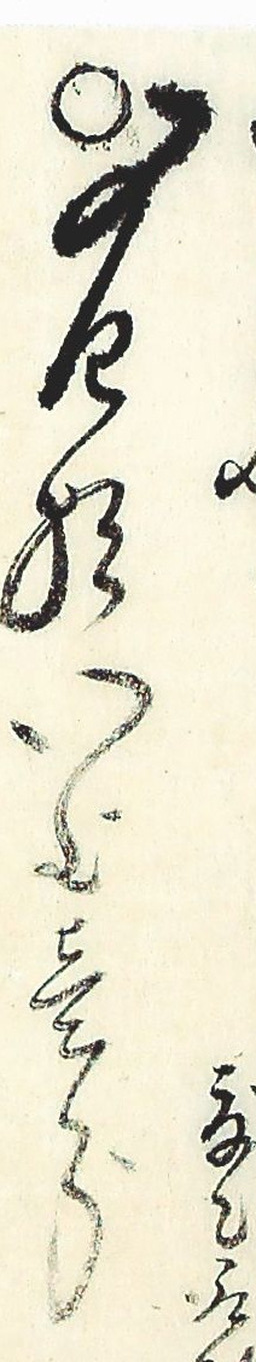〆四拾八匁壱分
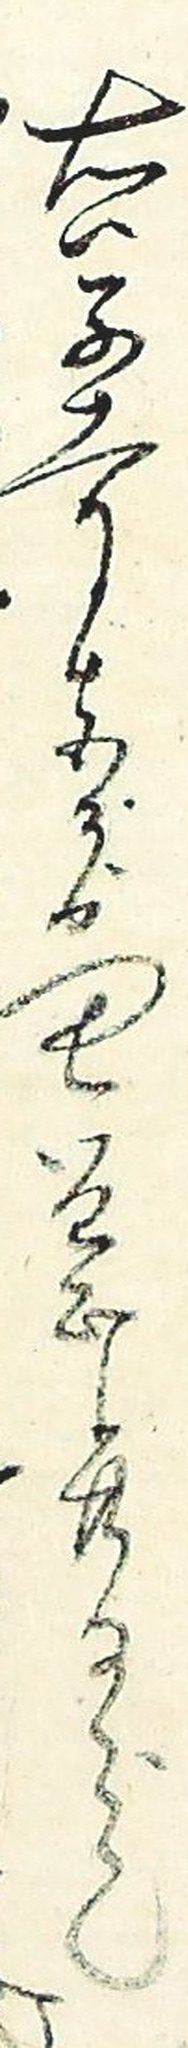右は子十一月十五日ゟ丑閏正月廿日迄
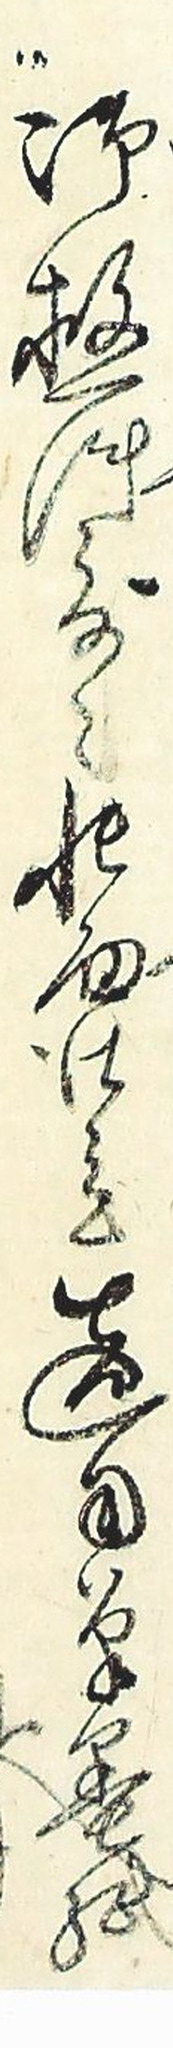御救一件度々帳面仕立造用筆墨紙
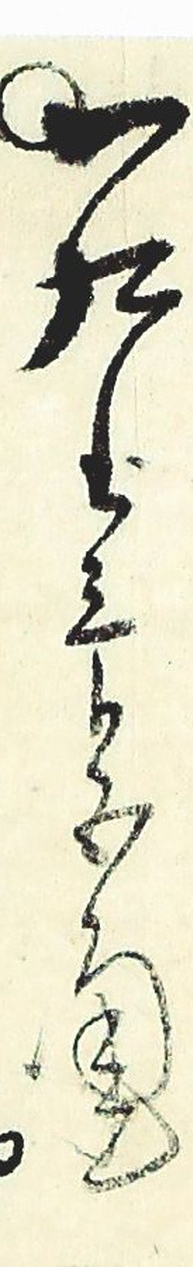一九匁三分五厘
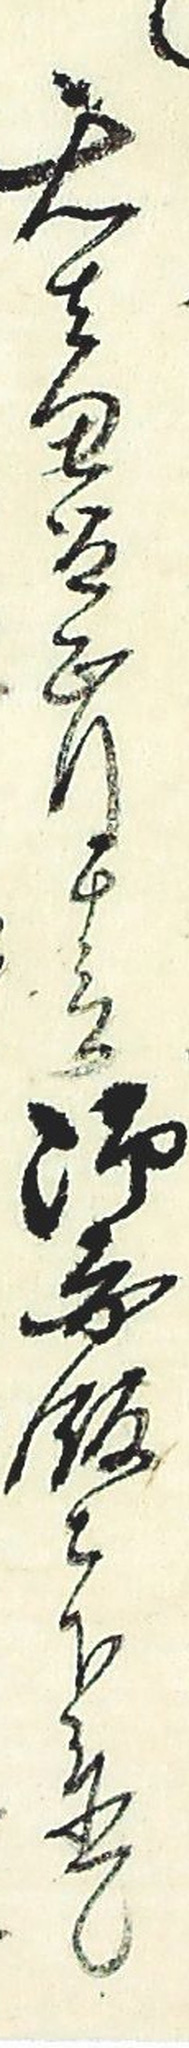右は丑閏正月十三日御赤飯被下置候
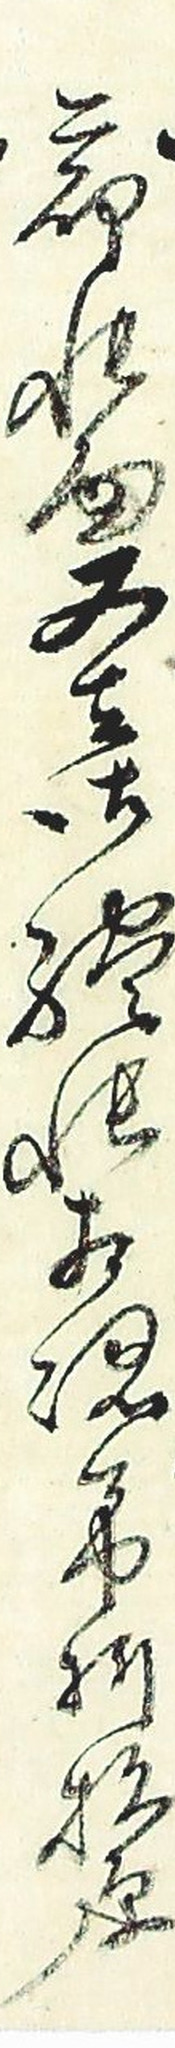節帳面又は御礼帳相認予折杉原
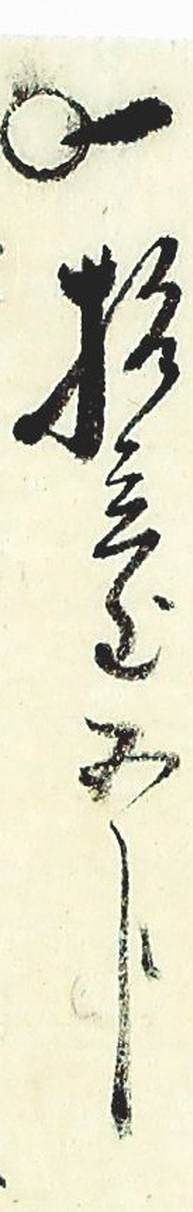一拾壱匁五分
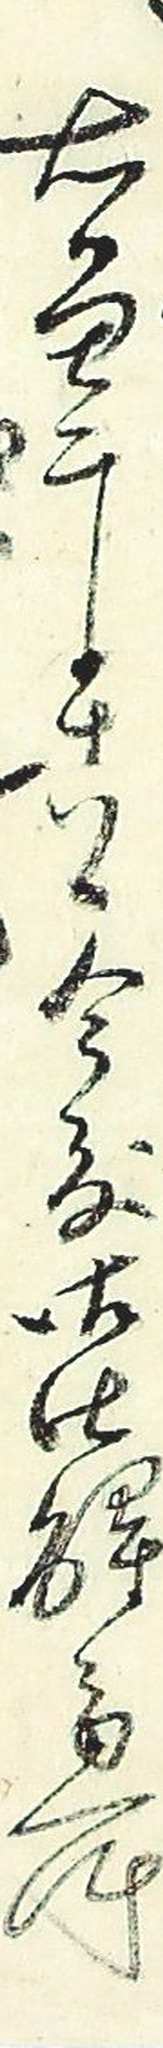右丑二月十八日今度御仕解方一件
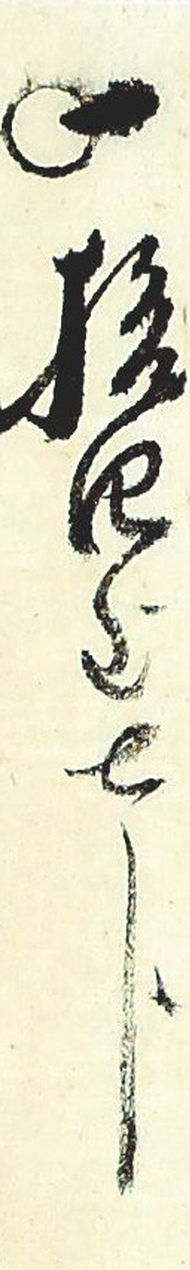一拾四匁七分
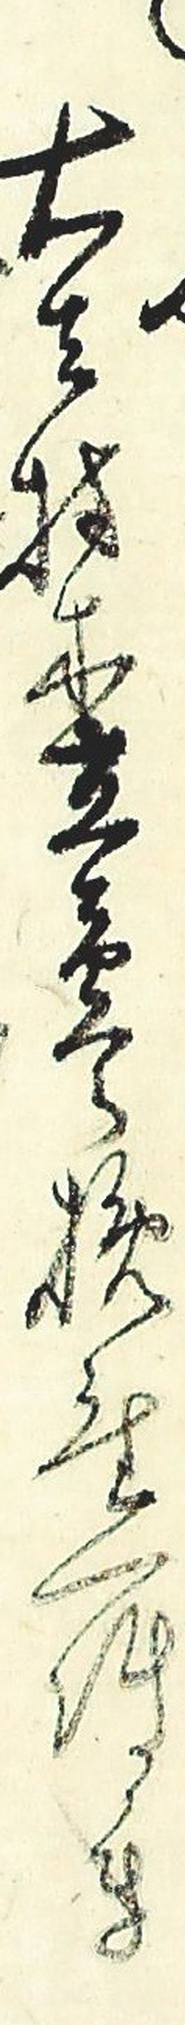右は村木立売り挽座一件に付
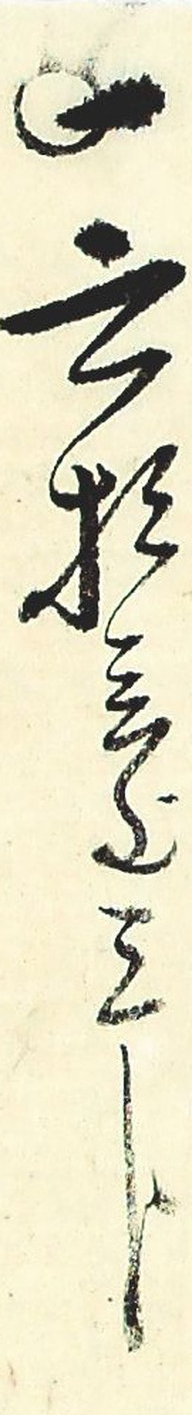一六拾壱匁三分
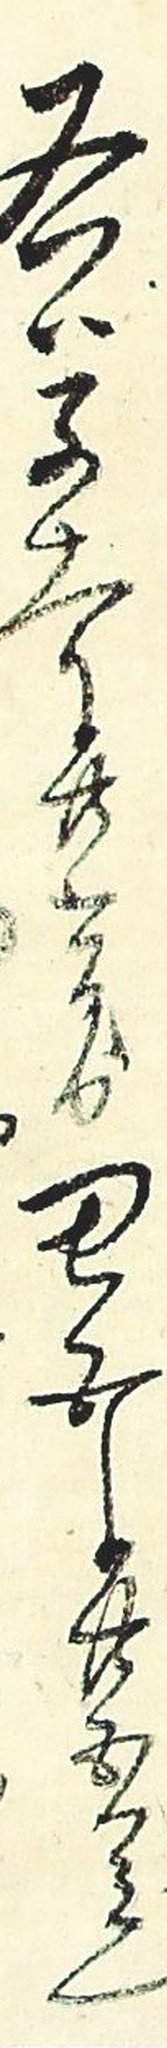右は子十一月廿六日ゟ丑五月廿五日迄
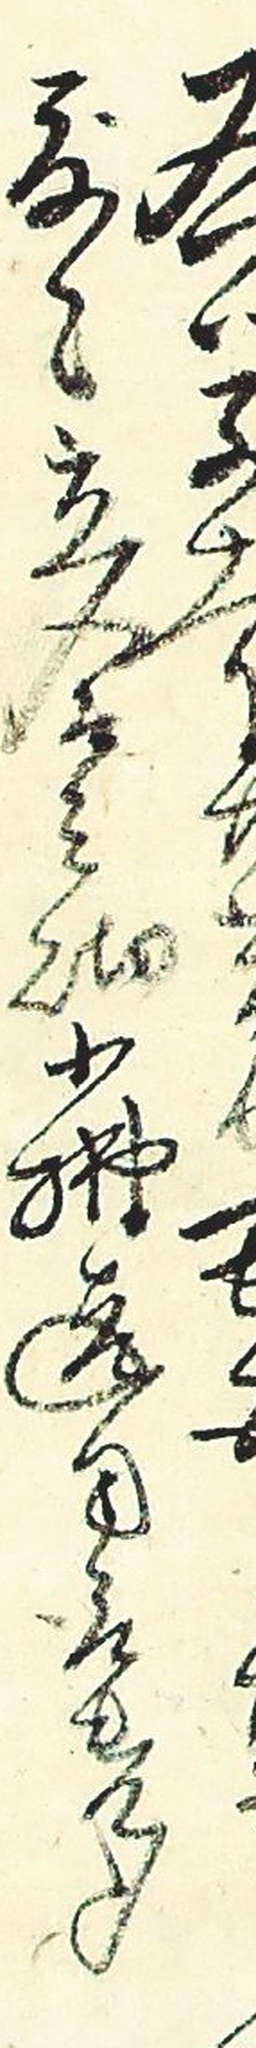度々立合之砌小払造用取替として
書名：名東郡中諸割賦元帳
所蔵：鳴門教育大学 Naruto University of Education
